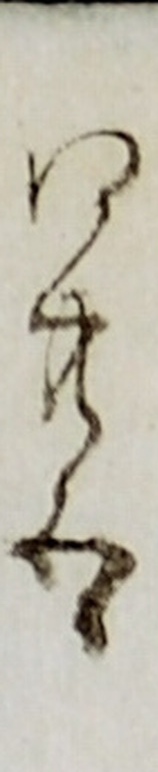同廿五日
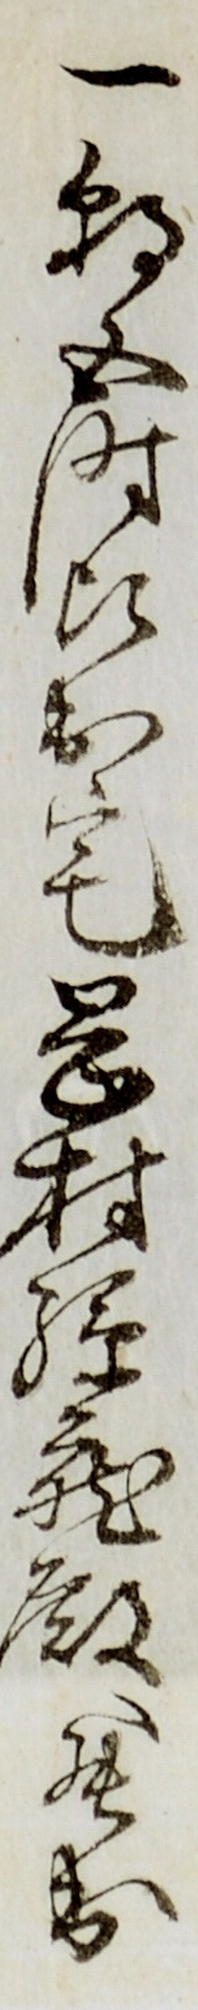一朝五時頃出宅岡村孫蔵殿へ罷出
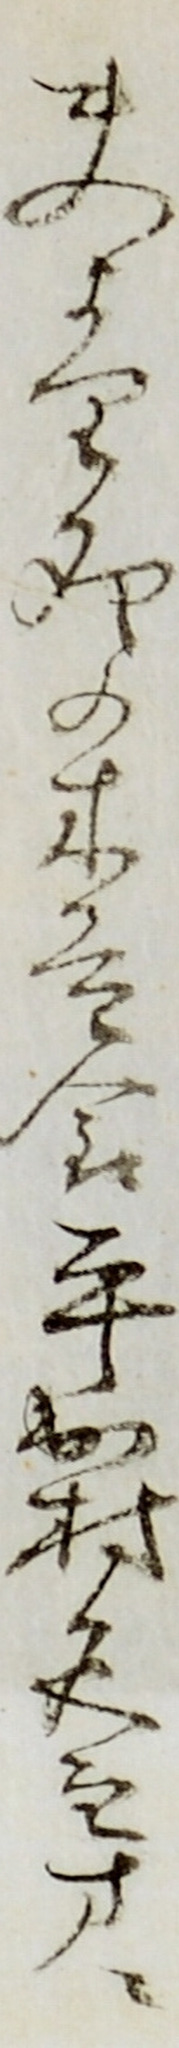夫より卯の木昼食平出村名主方に
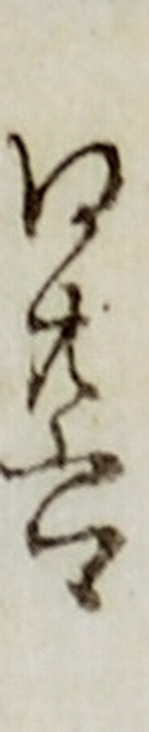同廿六日
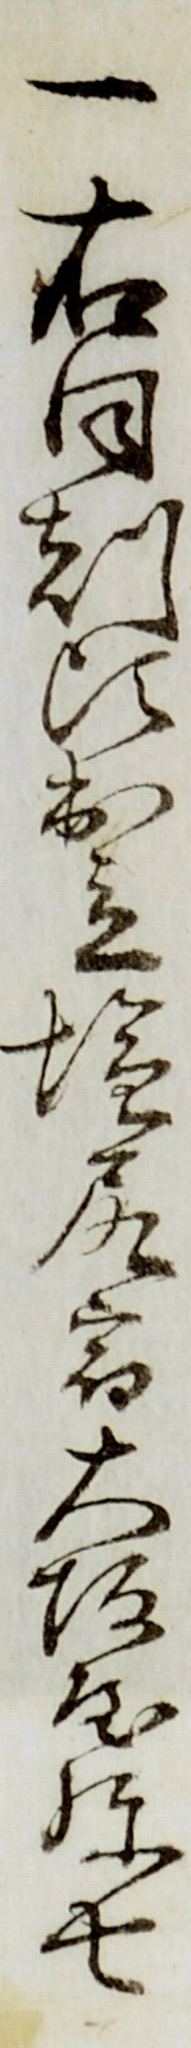一右同刻頃出立塩尻宿大坂屋孫七
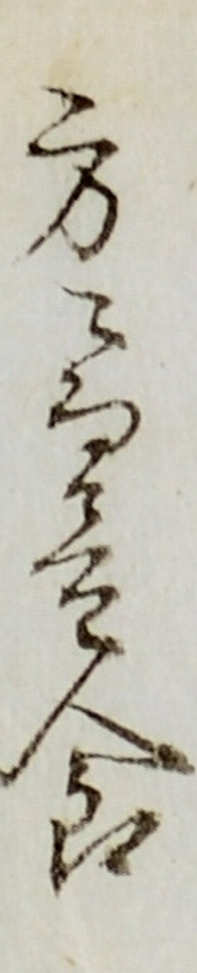方にて昼食
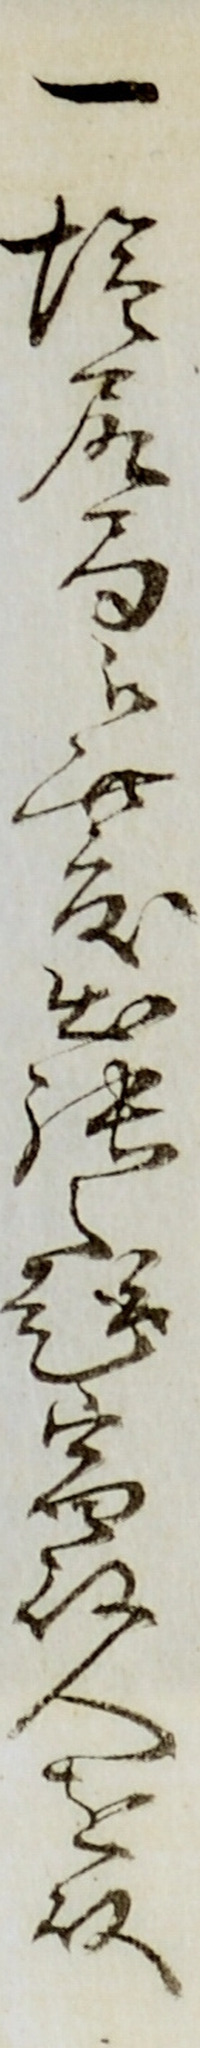一塩尻局え此度出張之趣宿役人を以
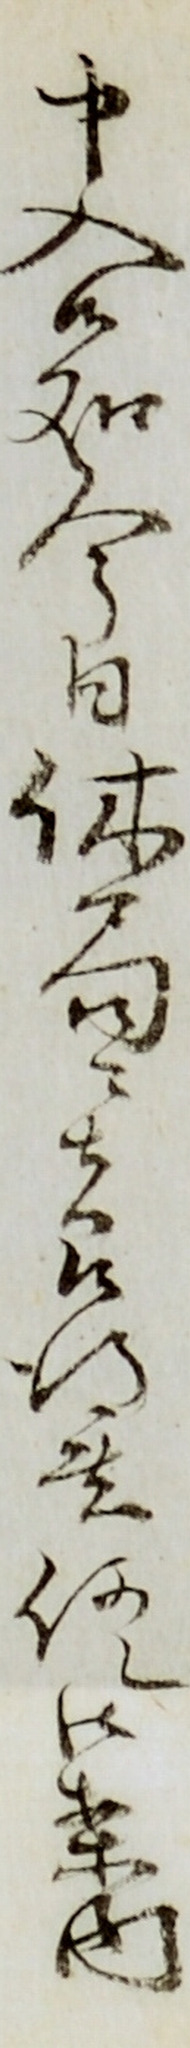申入候処今日休局には候得共何レ御案内
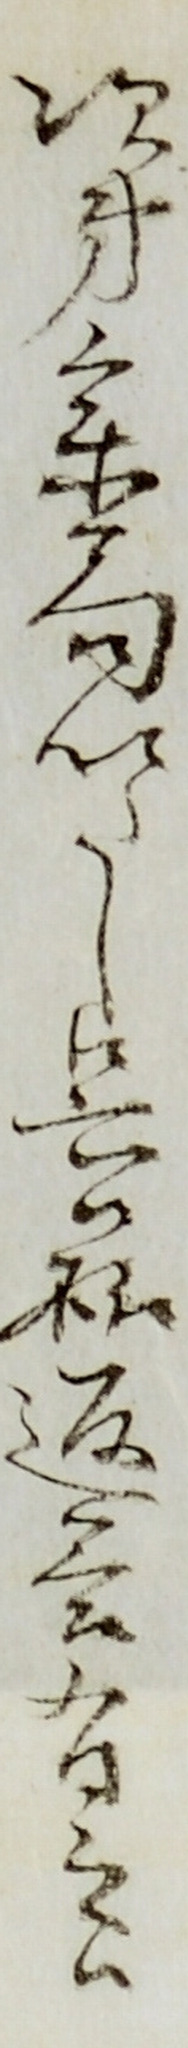次第参局いたし呉候様返答有之候
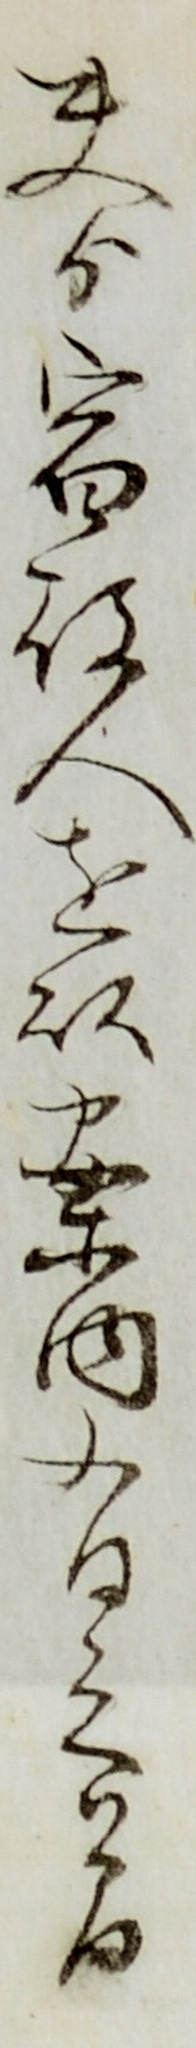夫ゟ宿役人を以案内有之候間
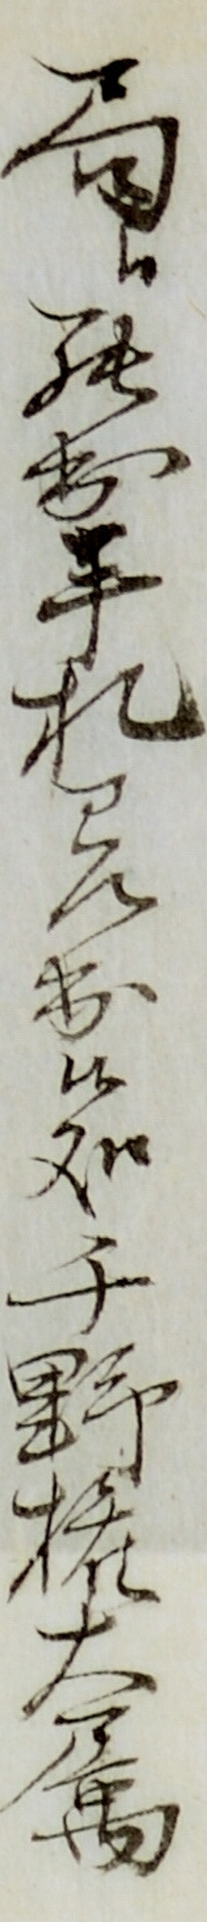局え罷出手札差出候処千野権大属

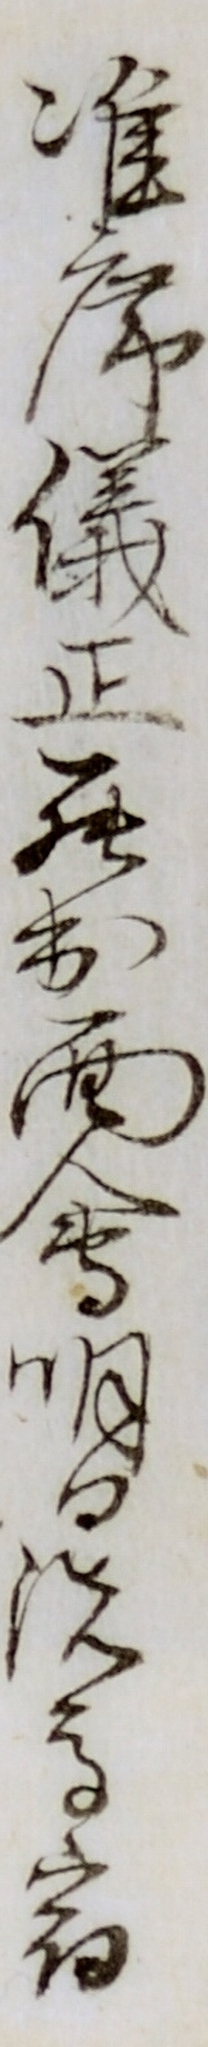准席儀正罷出面会明日洗馬宿
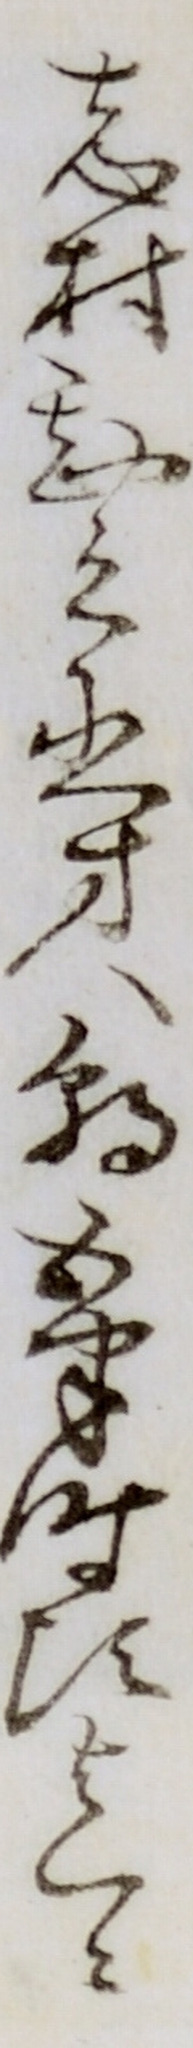志村勘之丞方へ朝五半時頃迄に
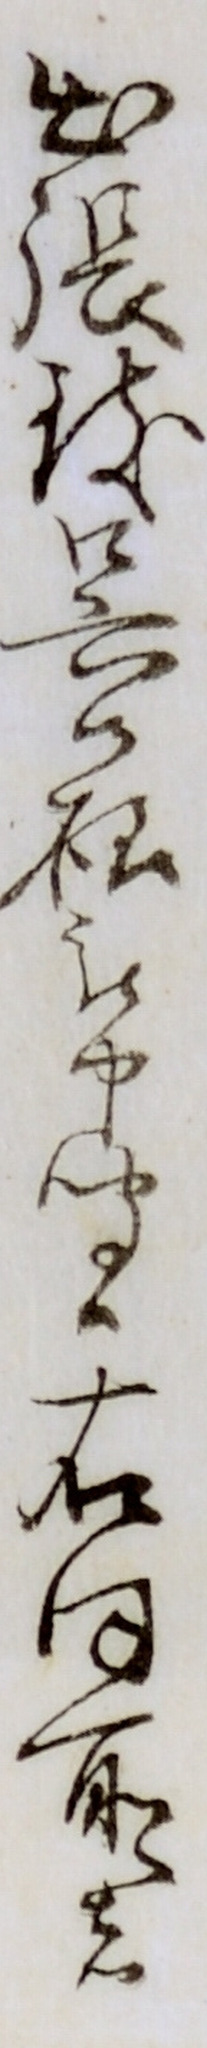出張致呉候様被申聞候右同所へは
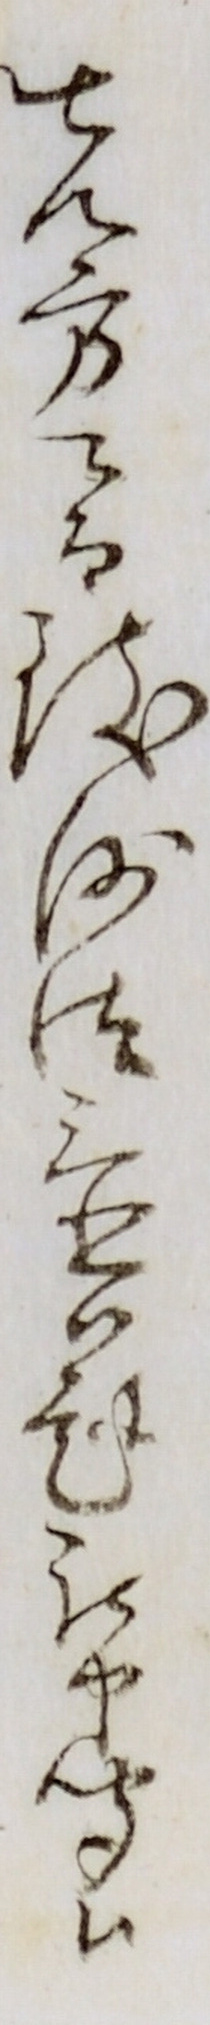先方にて致沙汰置候趣被申聞候
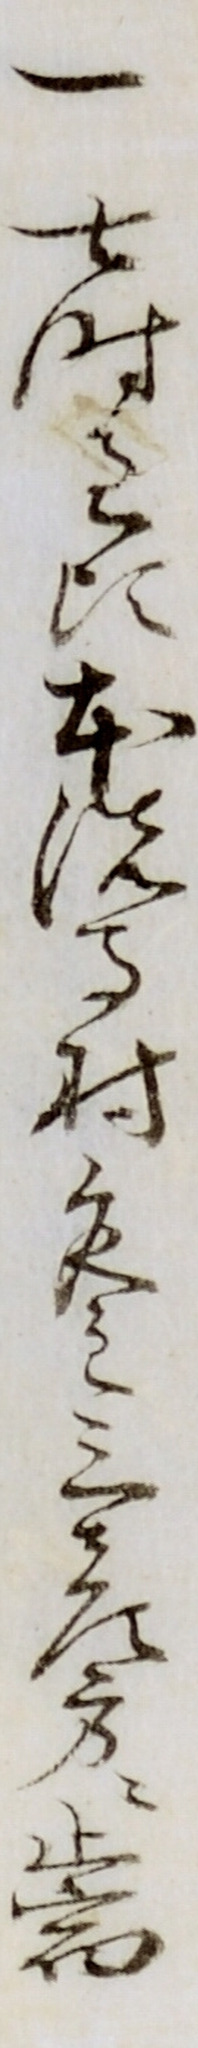一七時過頃本洗馬村名主三彦方に止宿
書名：山林方諸事御用留
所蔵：伊那市立高遠町図書館・合同会社AMANE
